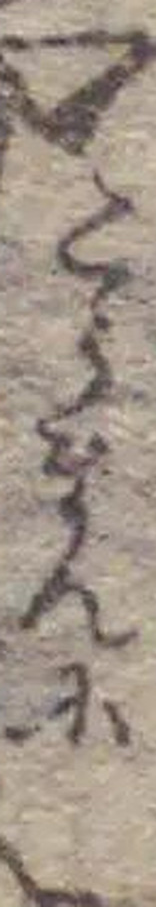こうまんに
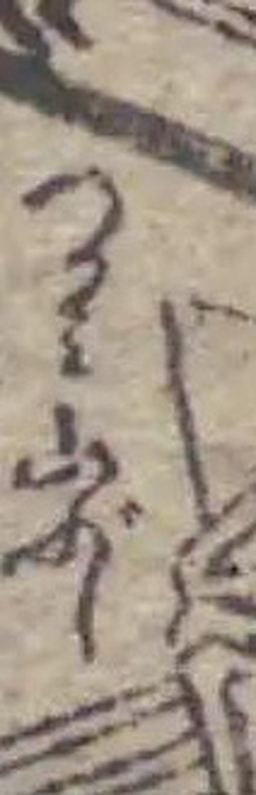つかみ山ぶし
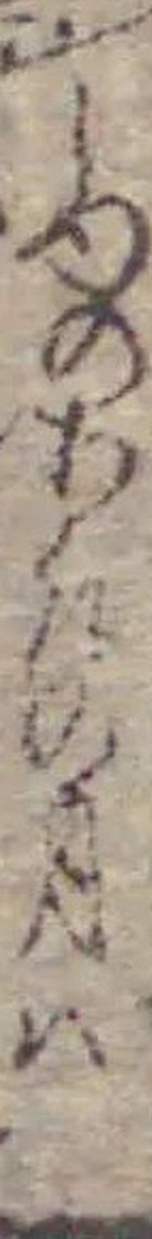しゆのあきの月は
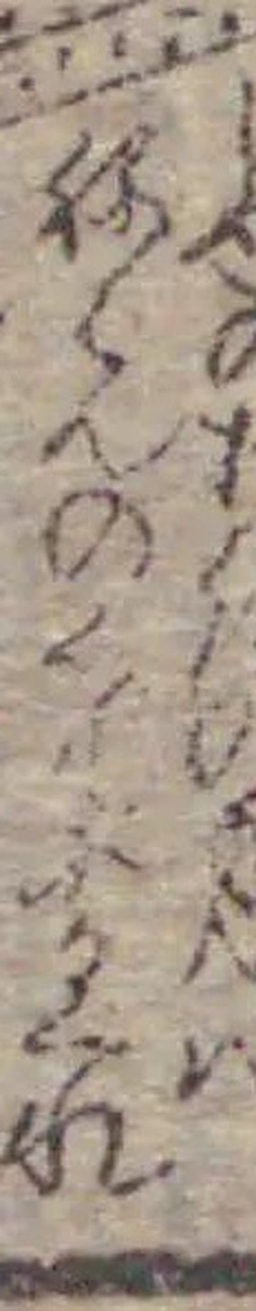ねはんのくもにかくれ
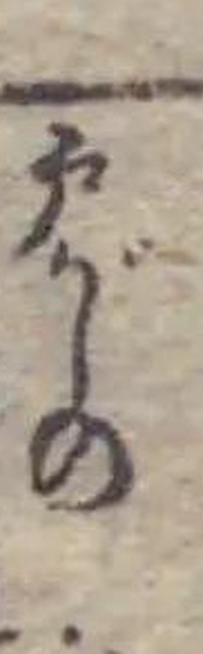戸がしの
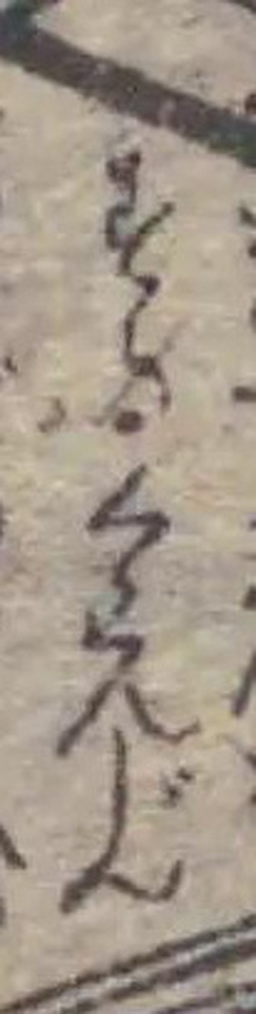するくわんじん
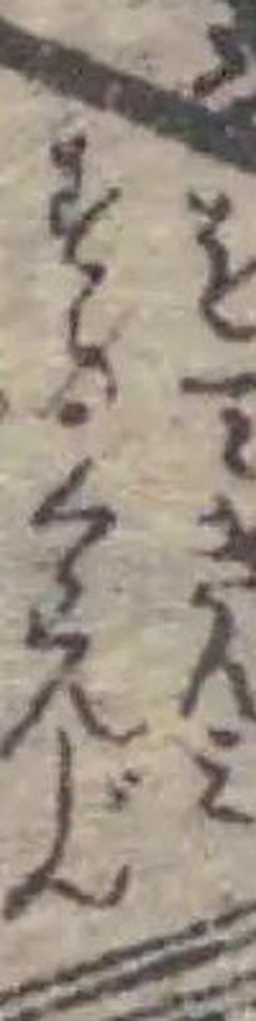するくわんじん
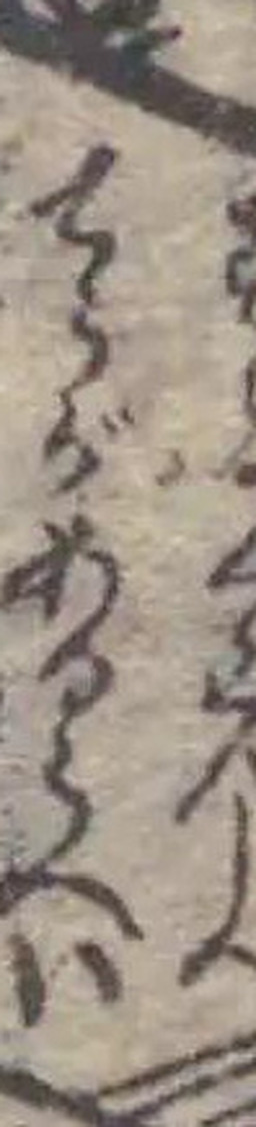てうがあるうへは
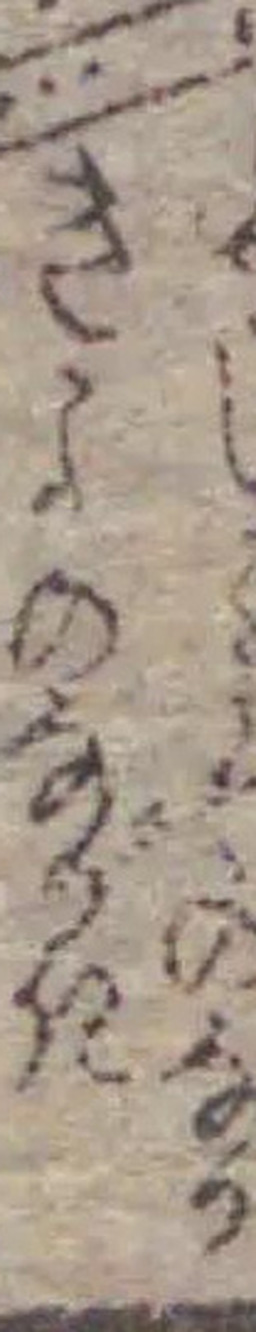きよのながき
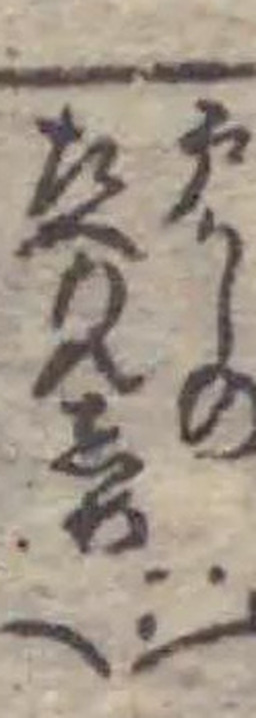左へもんしめ
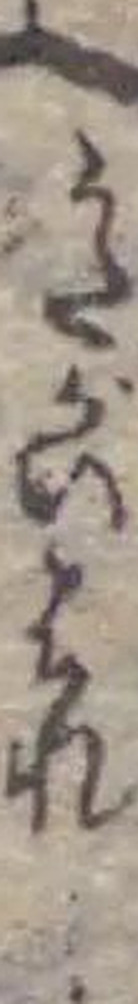うたがいはれ
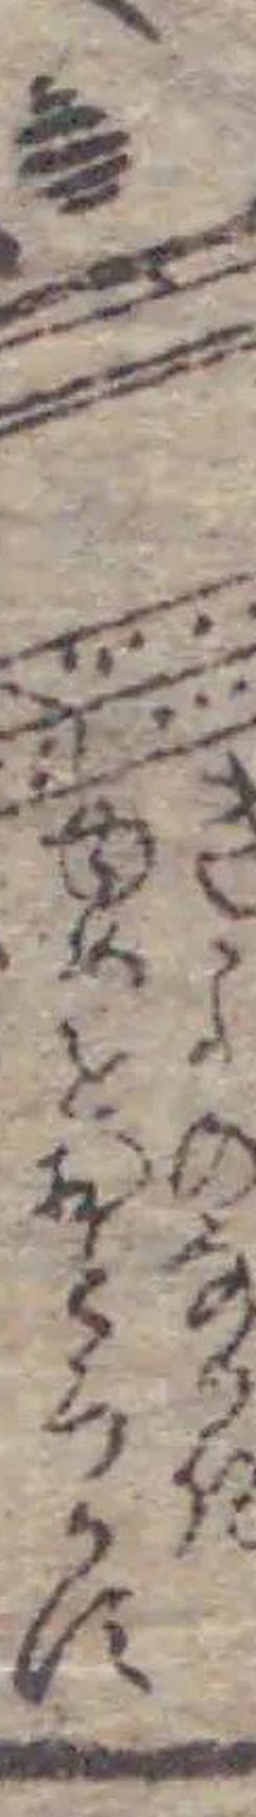ゆめをおとろかす
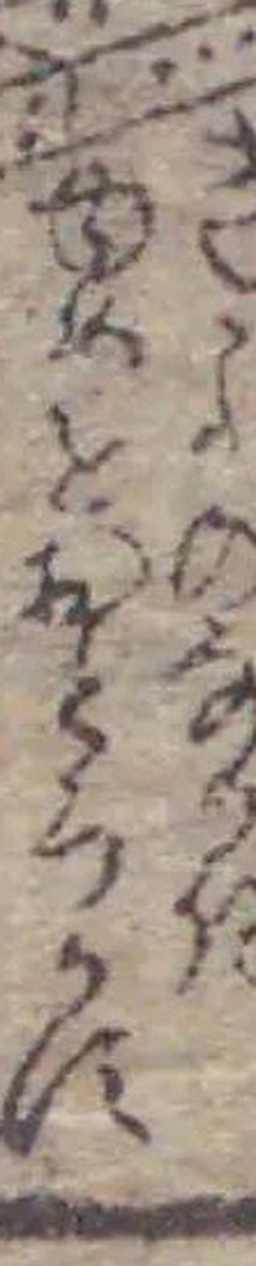ゆめをおとろかす
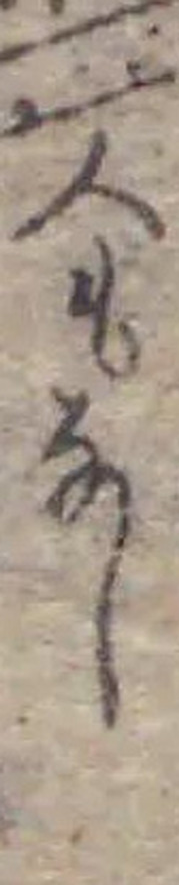人もなし
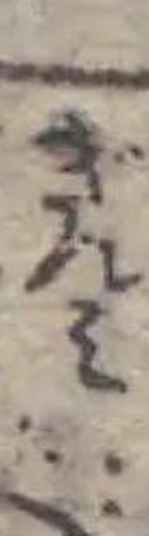ぎんみ
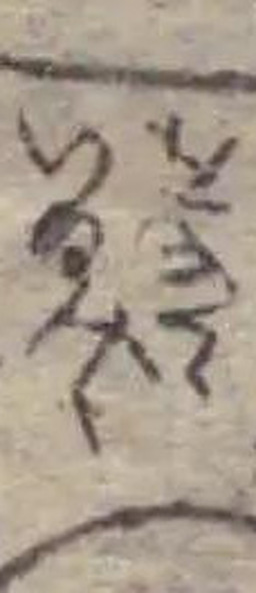いる人〳〵
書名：通増安宅関 2巻
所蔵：国立国会図書館 National Diet Library, JAPAN
